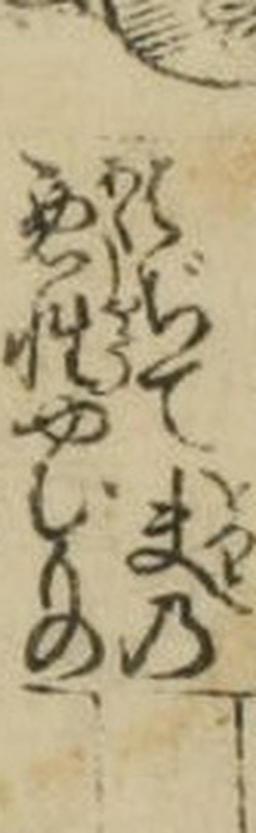悪性やむもの
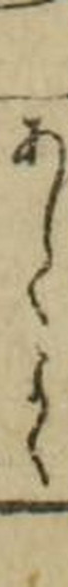あしくよく
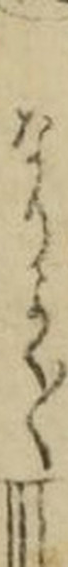なりよく〳〵
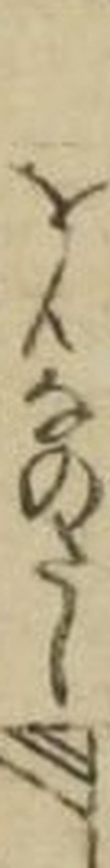をんなのたし
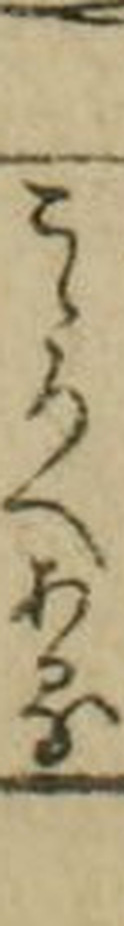こゝろへある
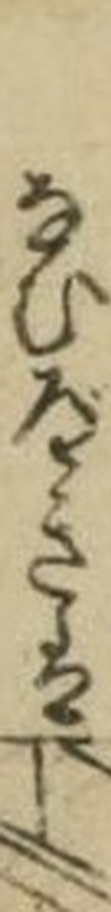なむべきは
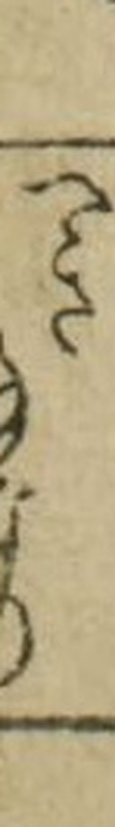事なり
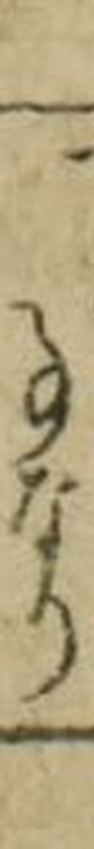事なり
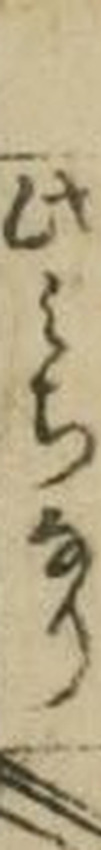此みちなり
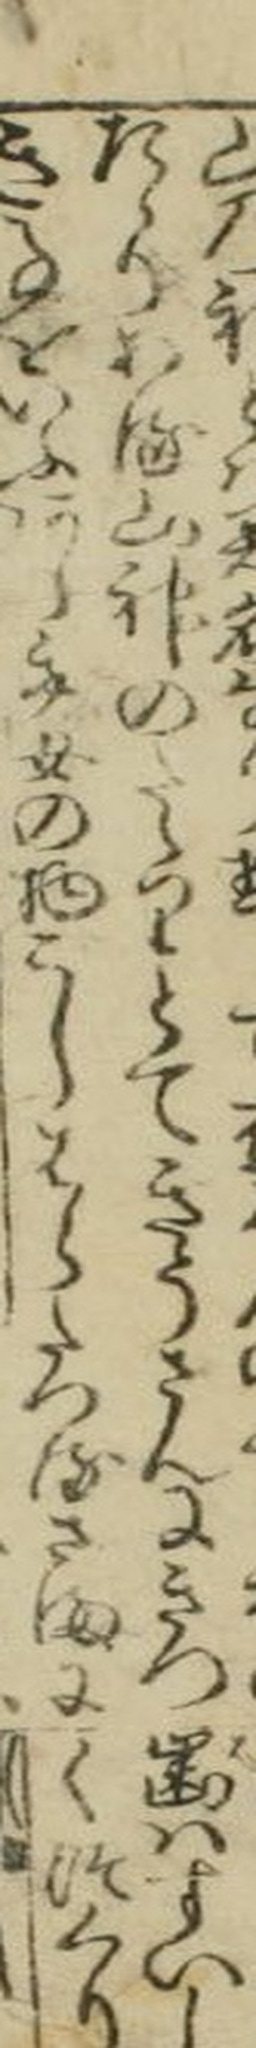き事をいふあら手女の物こしはらたつるさまに
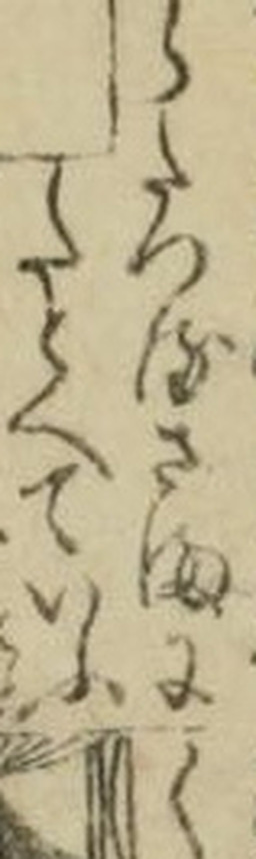たとへていふ
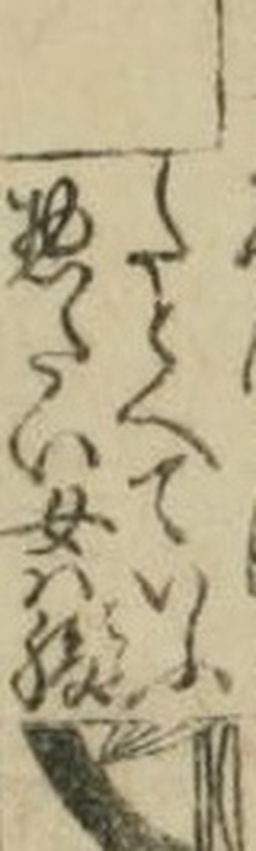惣たい女は腹
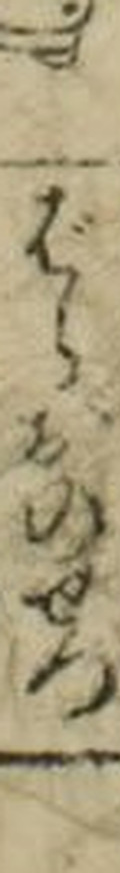ばらおのせつ
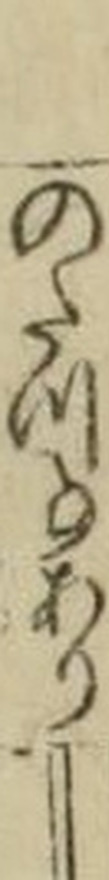のたつ事あり
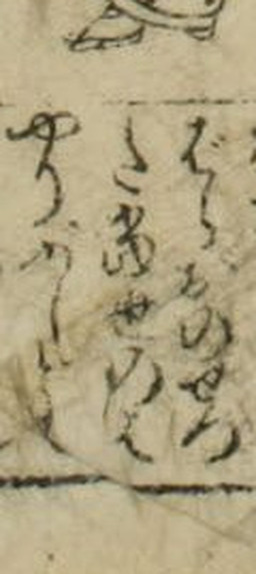た当世のは
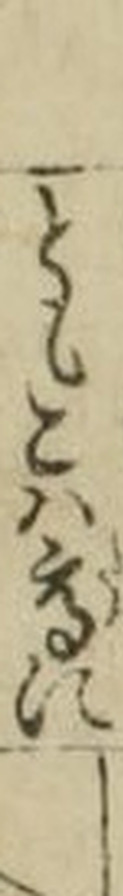ともこは高に
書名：女源氏教訓鑑
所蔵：東京学芸大学附属図書館
